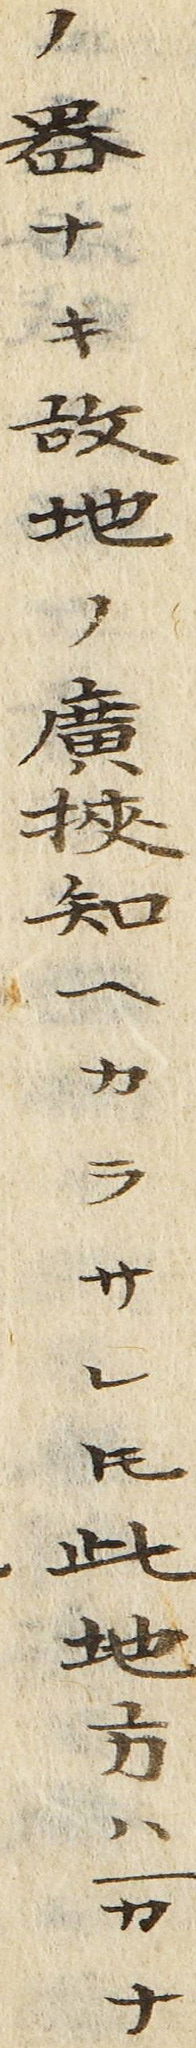ノ器ナキ故地ノ広挾知ヘカラサレトモ此地方は「カナ
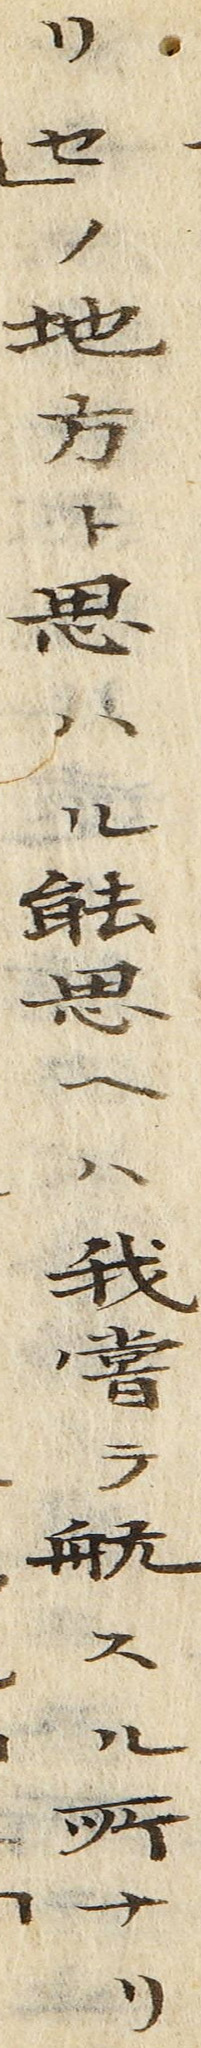リセ」ノ地方ト思ハル能思ヘハ我嘗テ航スル所ナリ
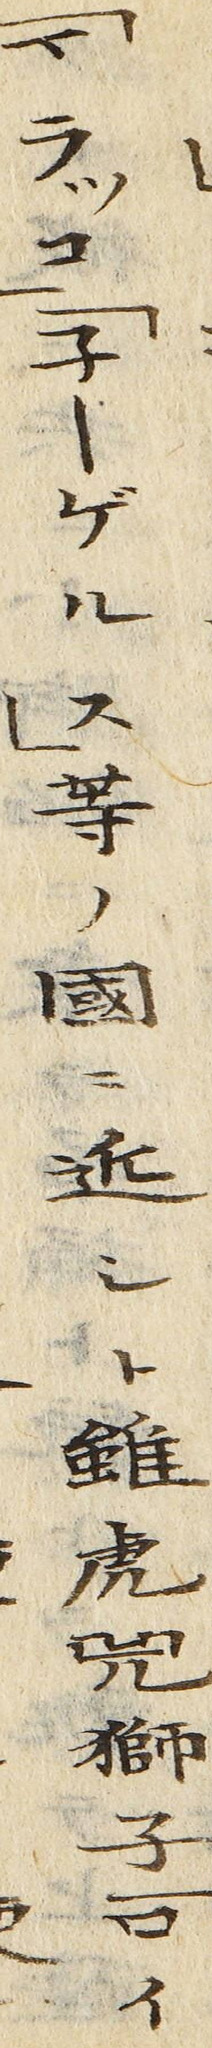「マラツコ」「ネーゲルス」等ノ国ニ近シト雖虎兕獅子「ロイ
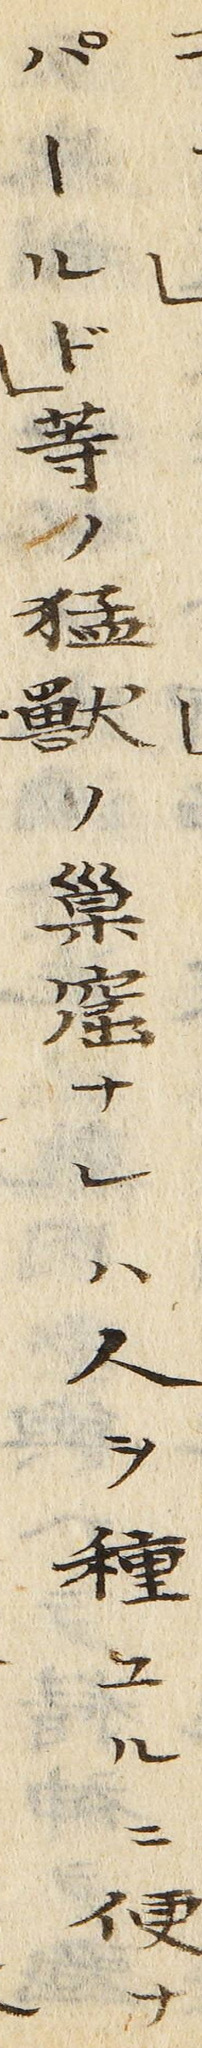パールド」等ノ猛獣ノ巣窟ナレハ人ヲ種ユルニ便ナ
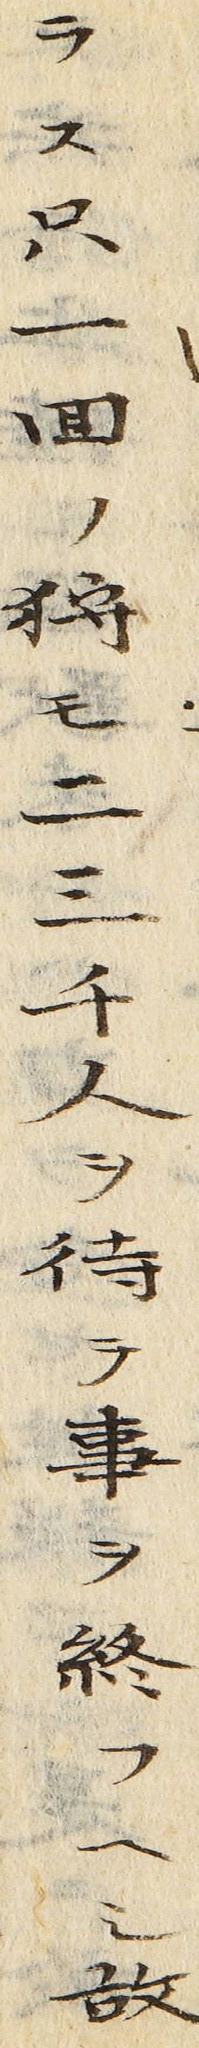ラス只一回ノ狩モ二三千人ヲ待テ事ヲ終フヘシ故
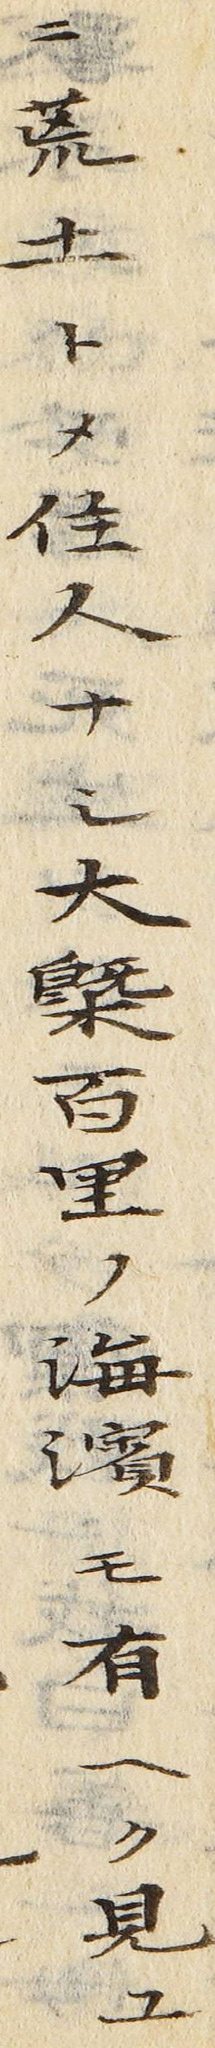ニ荒土トシテ住人ナシ大概百里ノ海浜モ有へク見ユ
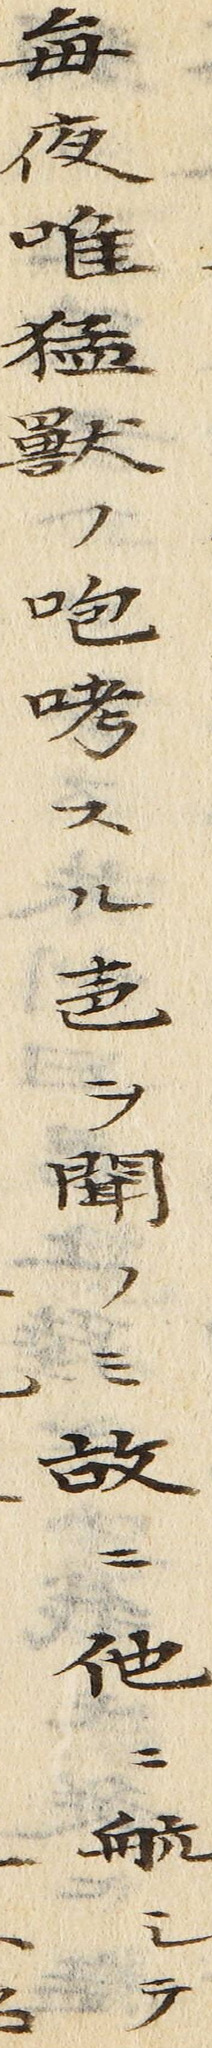毎夜唯猛獣ノ咆哮スル声ヲ聞ノミ故ニ他ニ航シテ
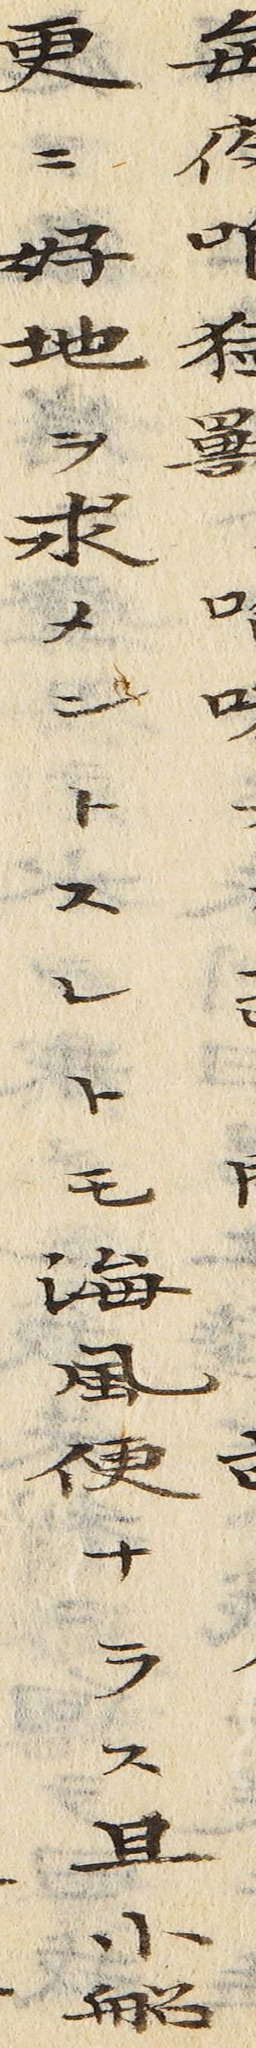更ニ好地ヲ求メントスレトモ海風便ナラス且小船
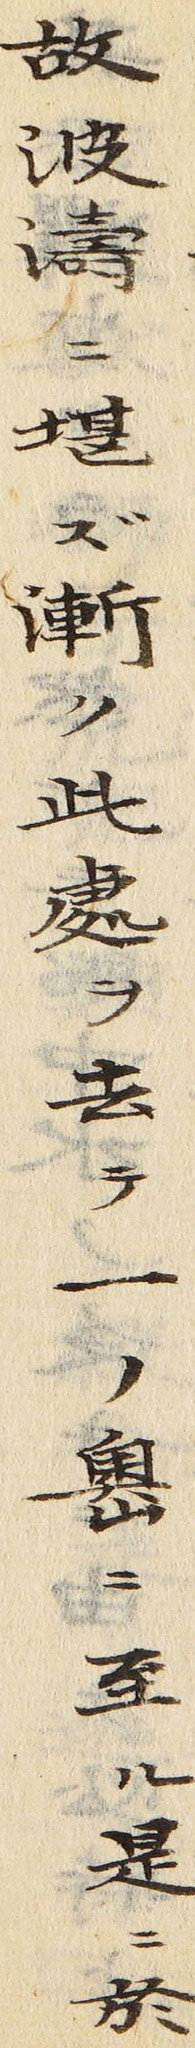故波濤ニ堪ズ漸ク此処ヲ去テ一ノ嶴ニ至ル是ニ於
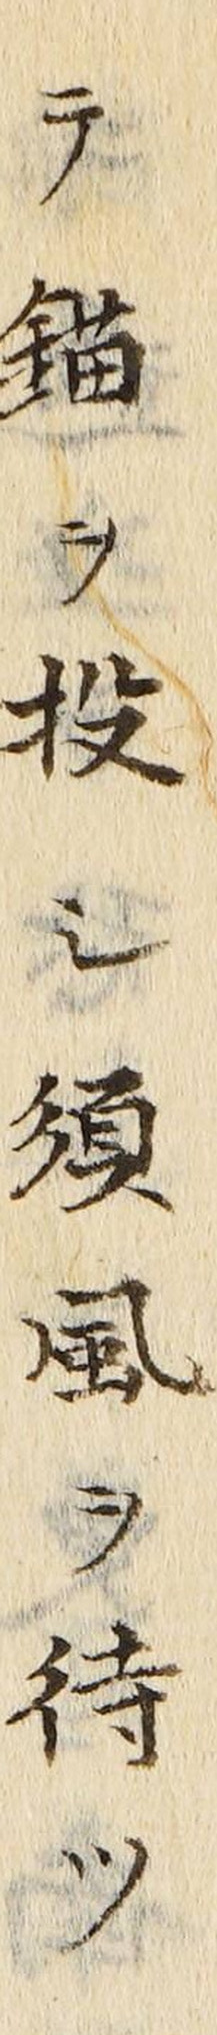テ錨ヲ投シ須風ヲ待ツ
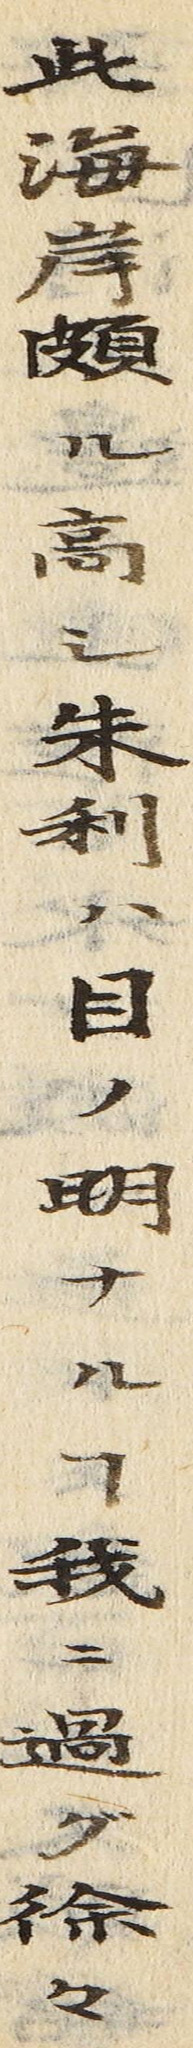此海岸頗ル高シ朱利ハ目ノ明ナルコト我ニ過グ徐々
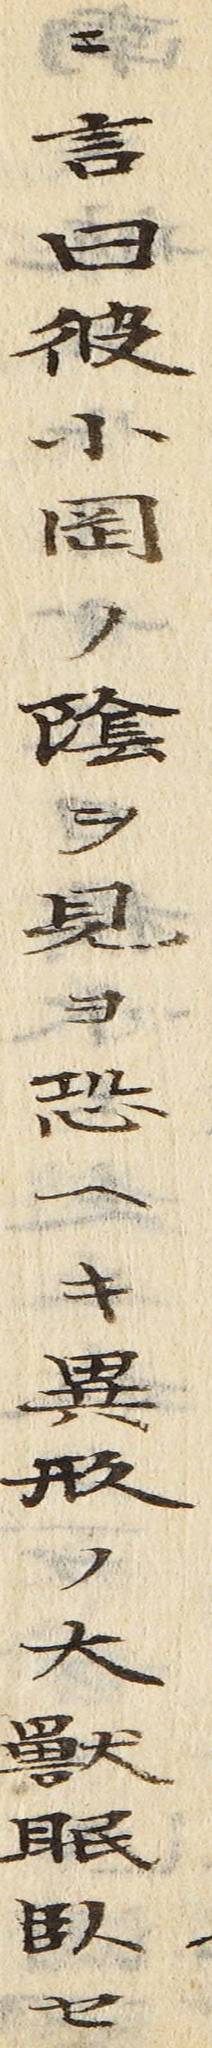ニ言曰彼小岡ノ陰ヲ見ヨ恐ヘキ異形ノ大獣眠臥セ
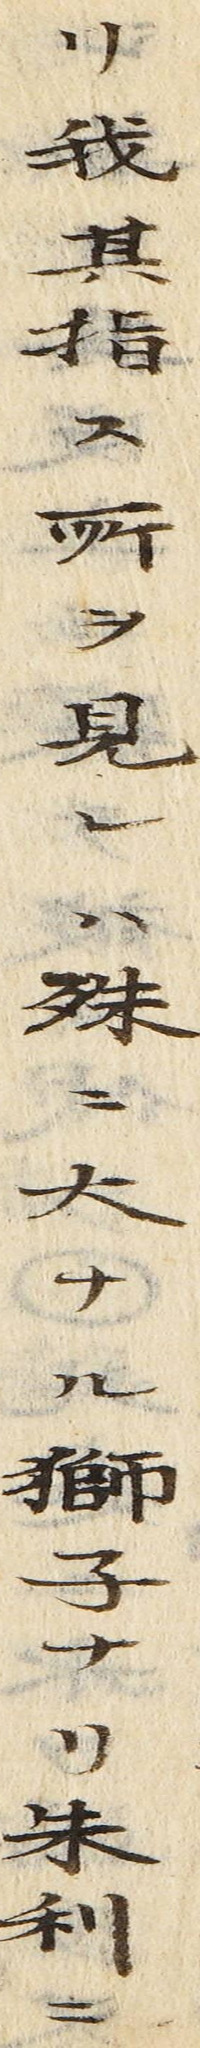リ我其指ス所ヲ見レハ殊ニ大ナル獅子ナリ朱利ニ
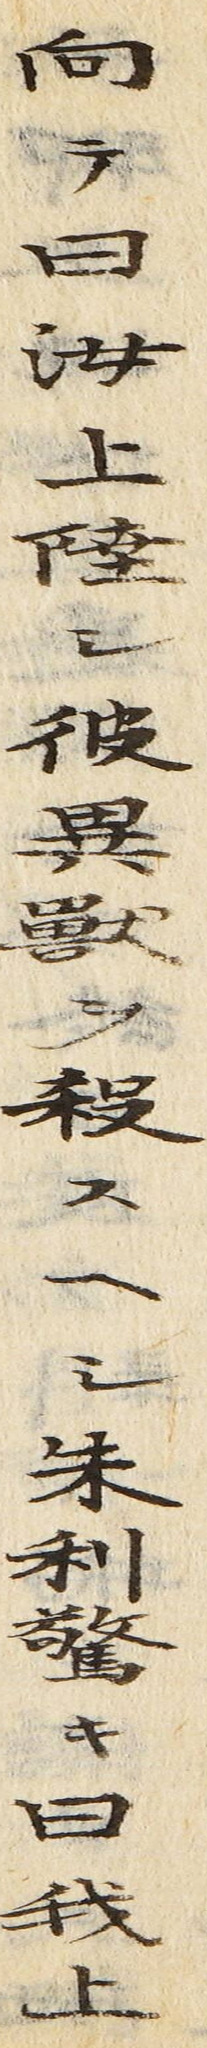向テ曰汝上陸シ彼異獣ヲ殺スヘシ朱利驚キ曰我上
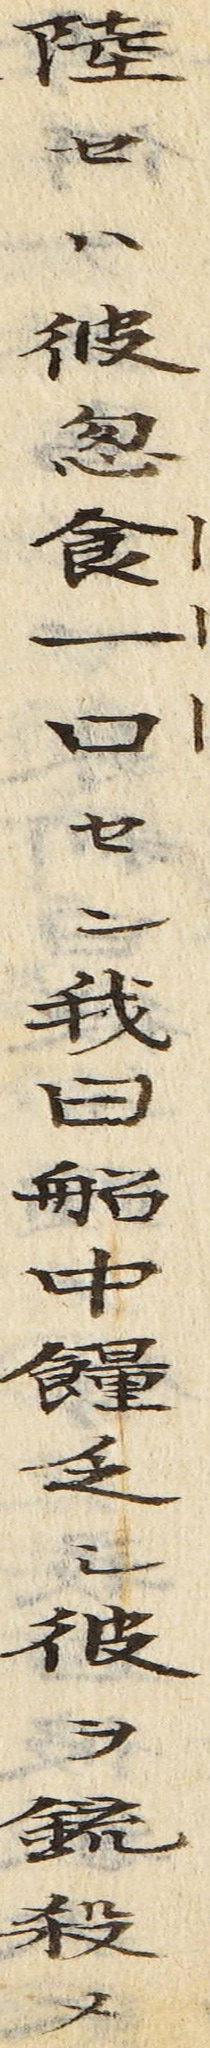陸セハ彼忽食一口セン我曰船中𩞯乏シ彼ヲ銃殺シテ
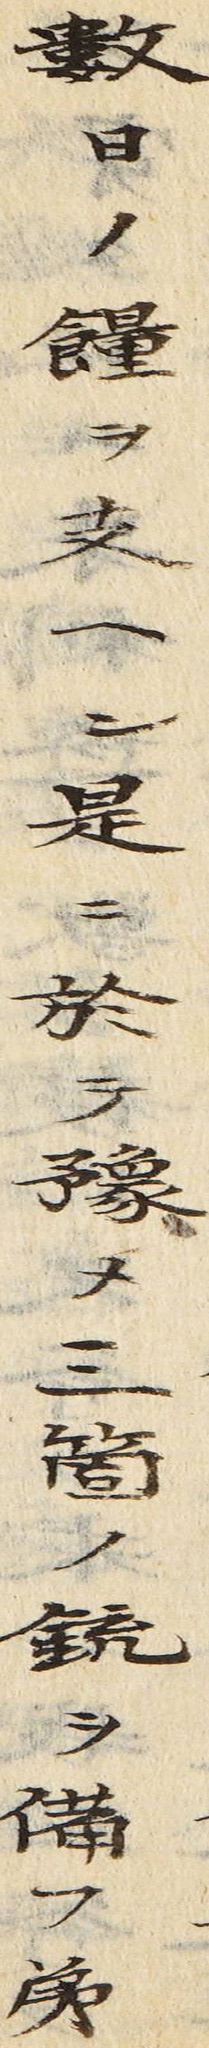数日ノ𩞯ヲ支ヘン是ニ於テ予メ三箇ノ銃ヲ備フ第
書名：漂流紀事
